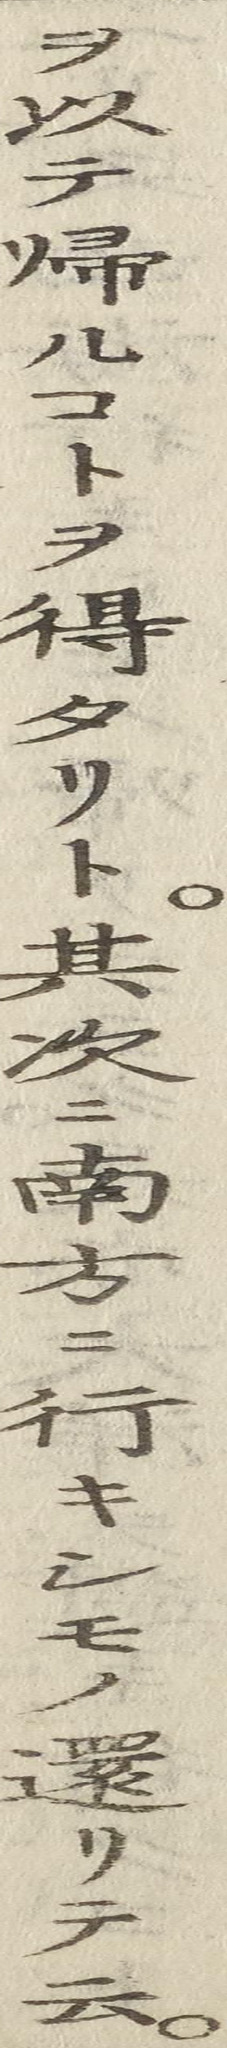ヲ以テ帰ルコトヲ得タリト。其次ニ南方ニ行キシモノ還リテ云。
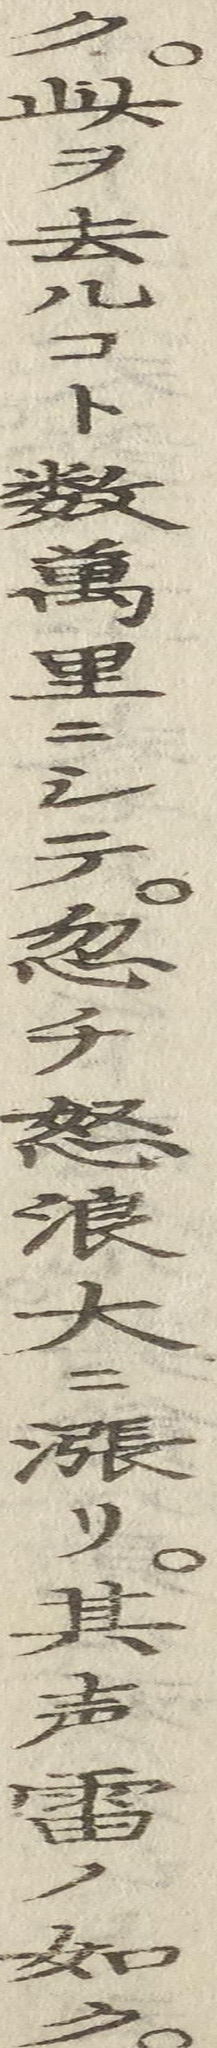ク。此ヲ去ルコト数万里ニシテ。忽チ怒浪大ニ漲リ。其声雷ノ如ク。
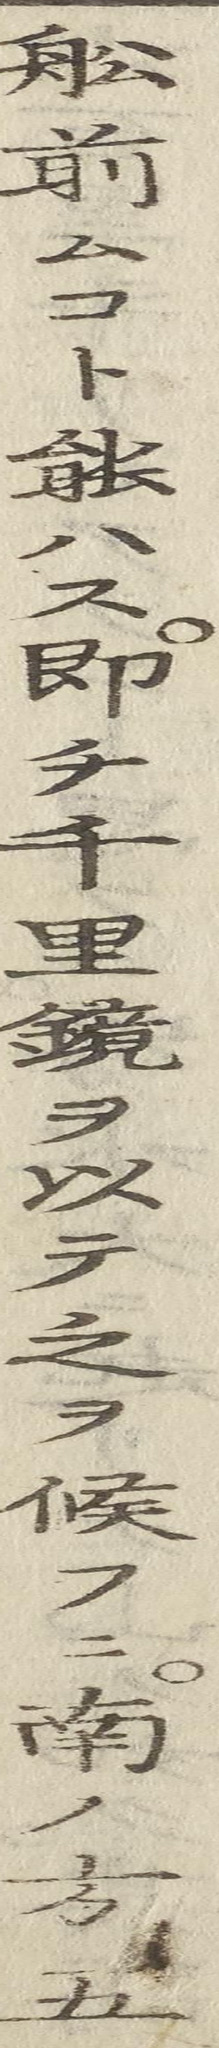舩前ムコト能ハス。即チ千里鏡ヲ以テ之ヲ候フニ。南ノ方五

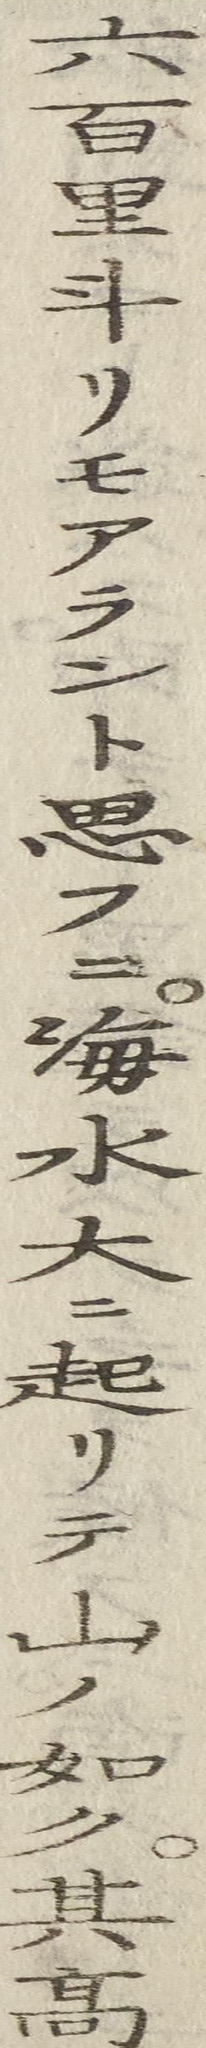六百里斗リモアラント思フニ。海水大ニ起リテ山ノ如ク。其高
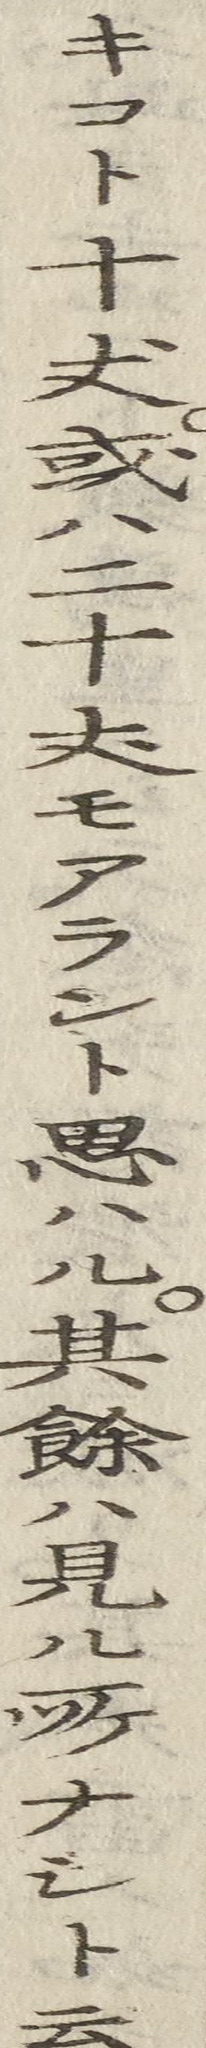キコト十丈。或ハ二十丈モアラント思ハル。其余ハ見ル所ナシト云
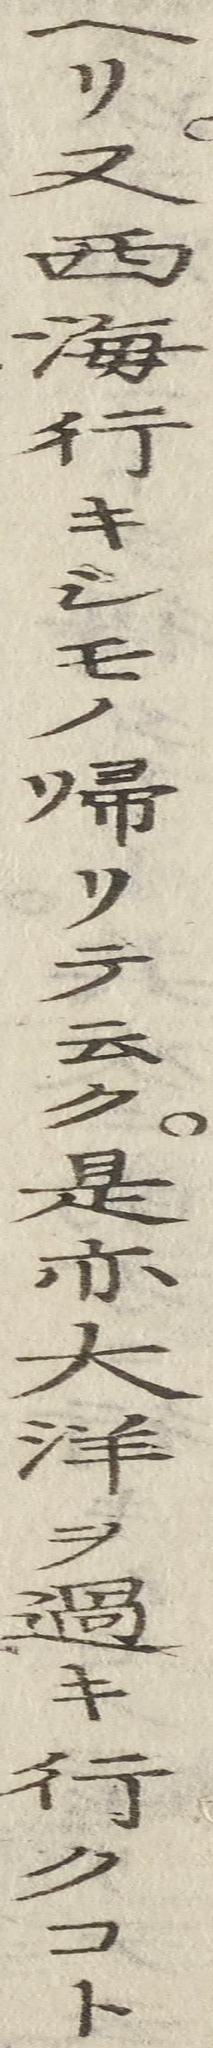ヘリ。又西海行キシモノ帰リテ云ク。是亦大洋ヲ過キ行クコト
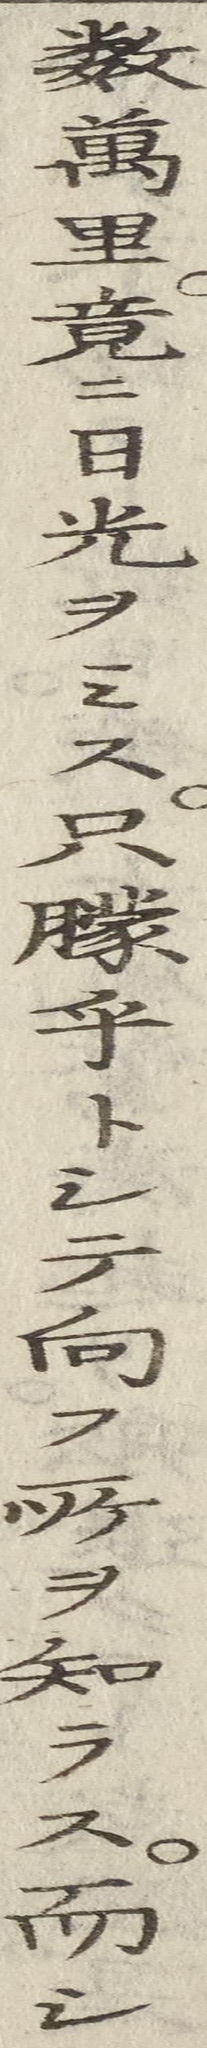数万里。竟ニ日光ヲミス。只曚乎トシテ向フ所ヲ知ラス。而シ
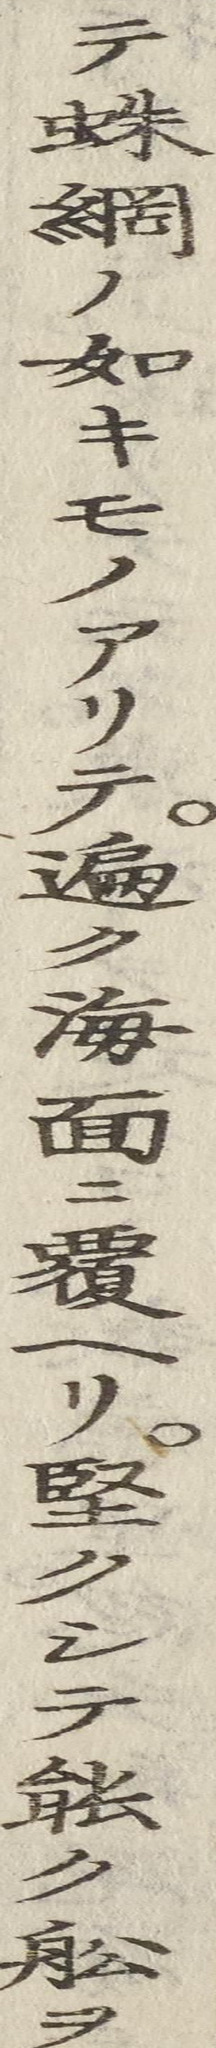テ蛛網ノ如キモノアリテ。遍ク海面ニ覆ヘリ。堅クシテ能ク舩ヲ
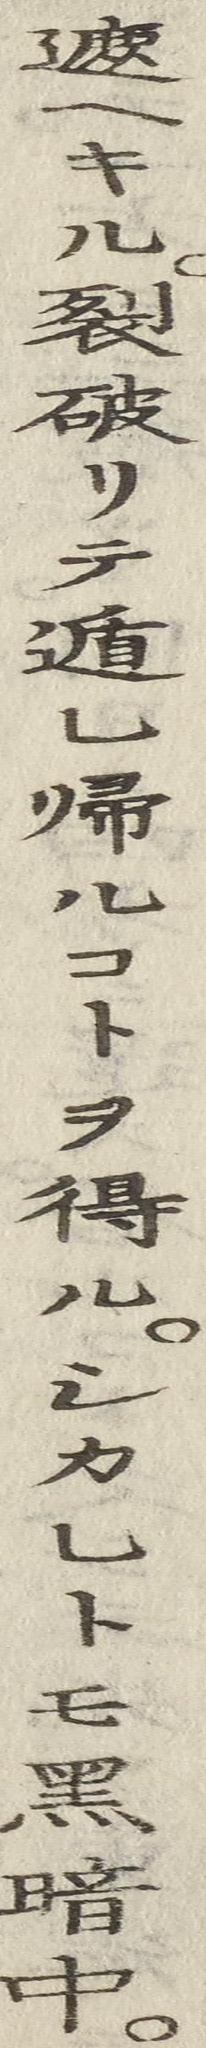遮ヘキル。裂破リテ遁レ帰ルコトヲ得ル。シカレトモ黒暗中。
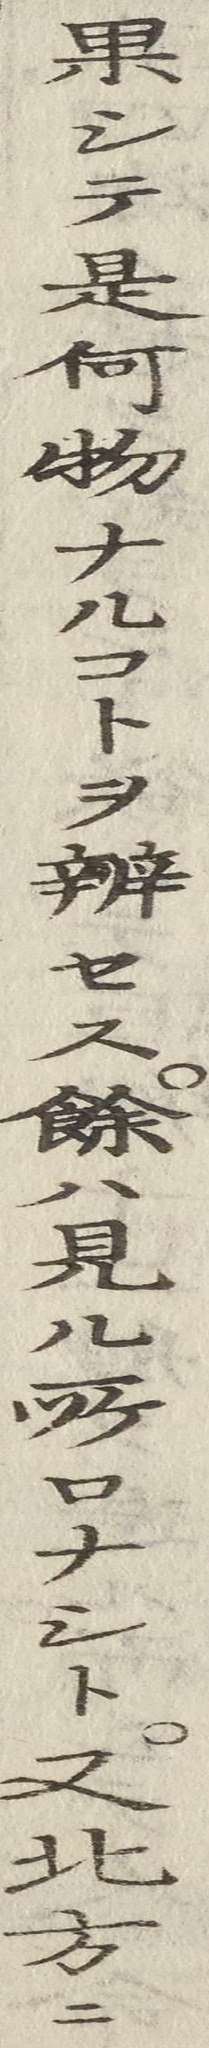果シテ是何物ナルコトヲ弁セス。余ハ見ル所ロナシト。又北方ニ
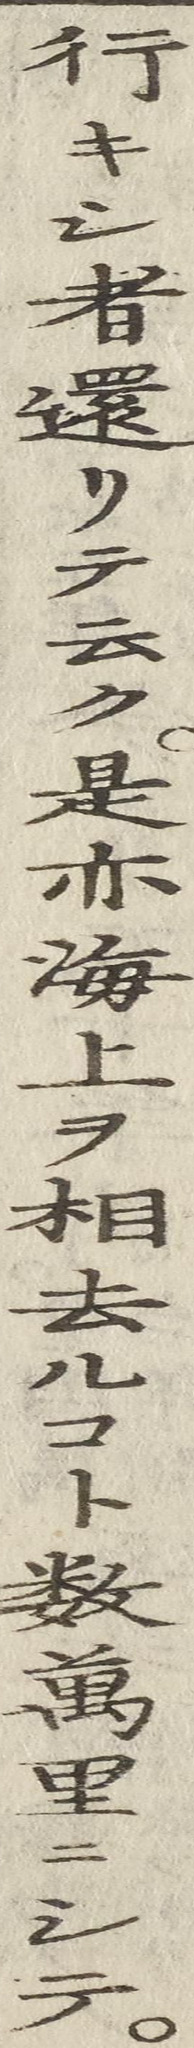行キシ者還リテ云ク。是亦海上ヲ相去ルコト数万里ニシテ。
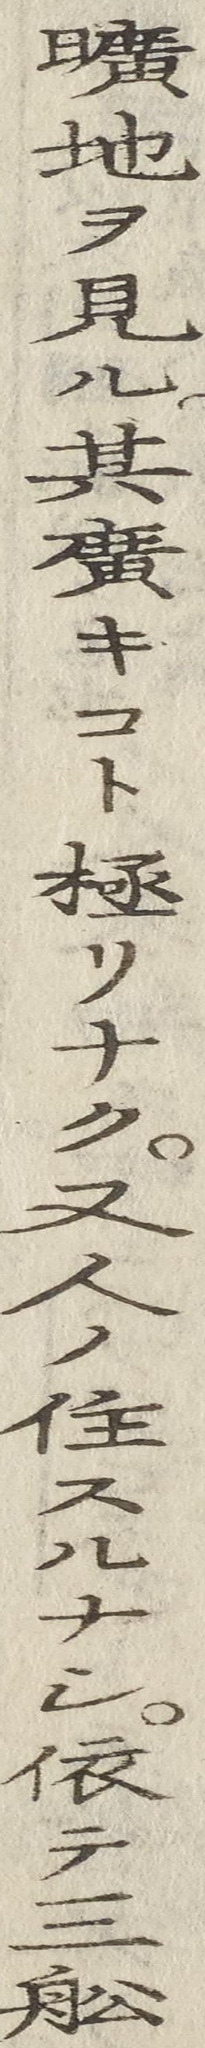昿地ヲ見ル。其広キコト極リナク。又人ノ住スルナシ。依テ三舩
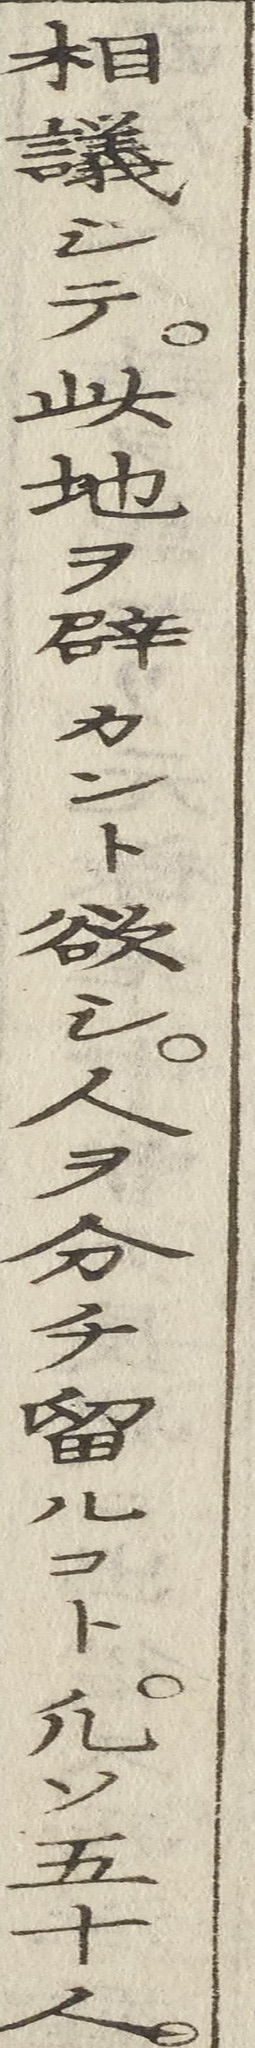相議シテ。此地ヲ辟カント欲シ。人ヲ分チ留ルコト。凡ソ五十人。
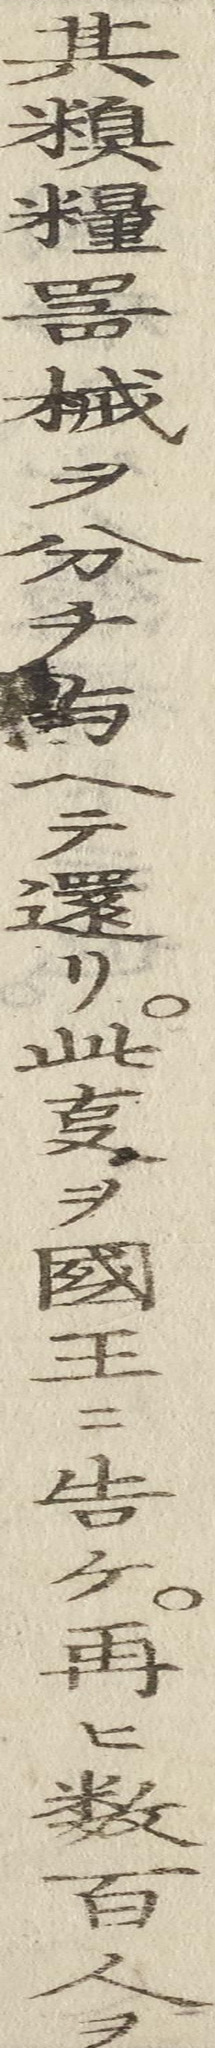其糗糧器械ヲ分チ与ヘテ還リ。此事ヲ国王ニ告ケ。再ヒ数百人ヲ
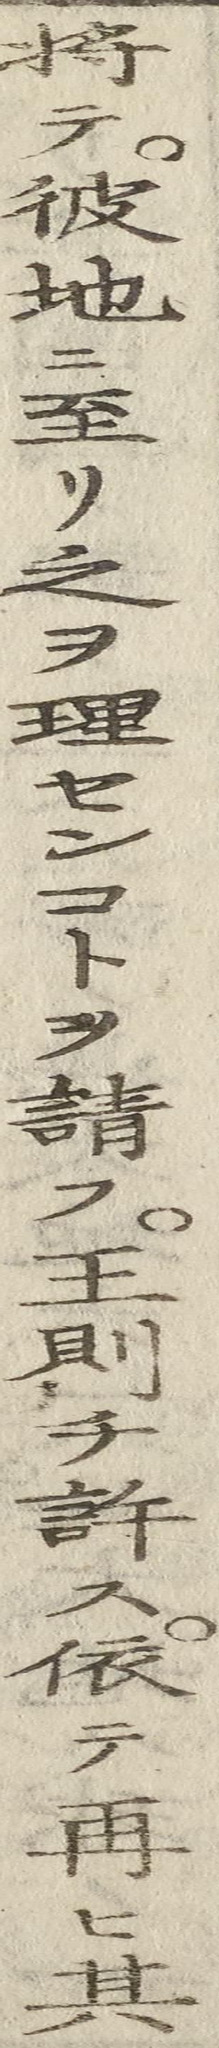将テ。彼地ニ至リ之ヲ理センコトヲ請フ。王則チ許ス。依テ再ヒ其
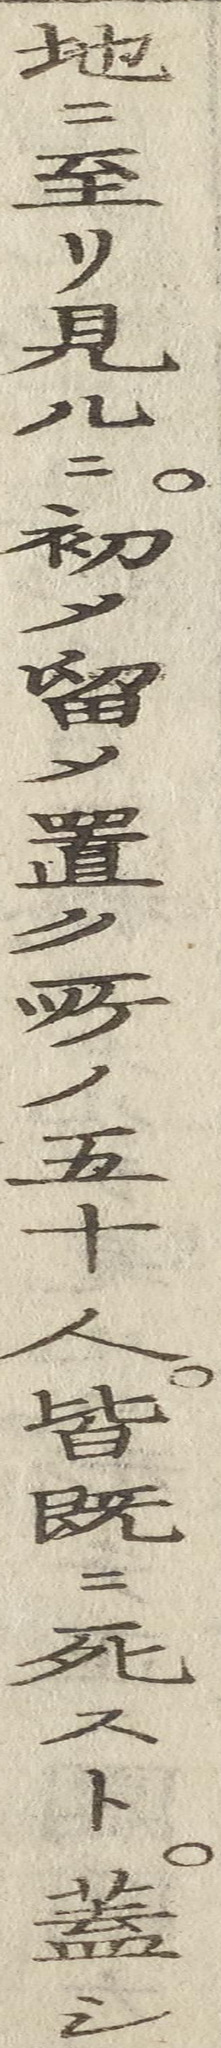地ニ至リ見ルニ。初メ留メ置ク所ノ五十人。皆既ニ死スト。蓋シ
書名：護法新論　中
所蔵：東京大学地震研究所図書室 Earthquake Research Institute Library, The University of Tokyo, JAPAN
